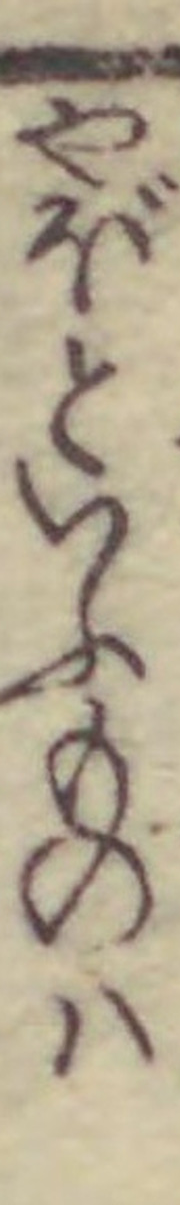やぼといふものは
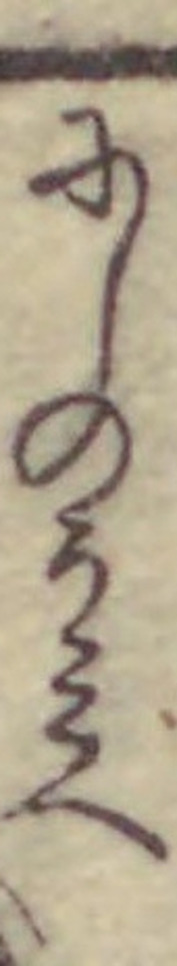にしのうみへ
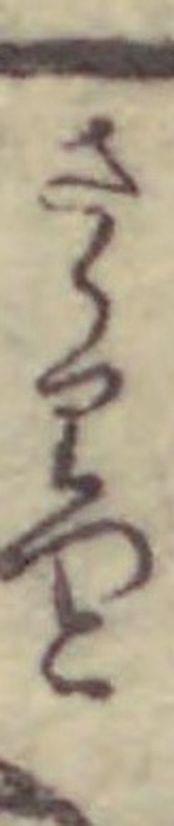さらりつと

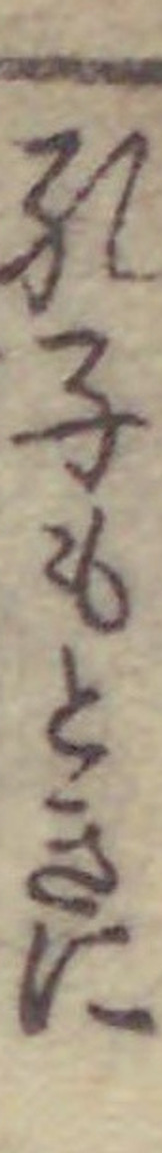孔子もときに
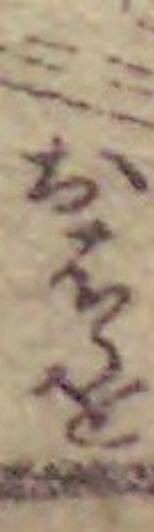おはらを
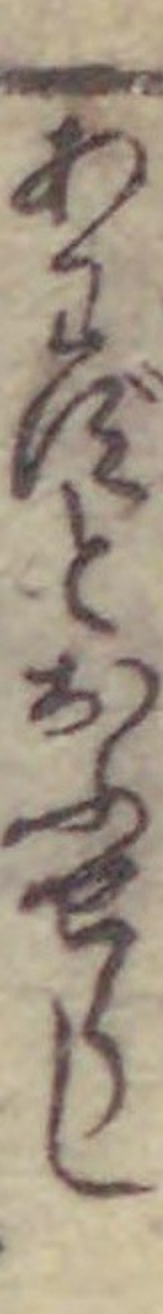あわずとおふせらし
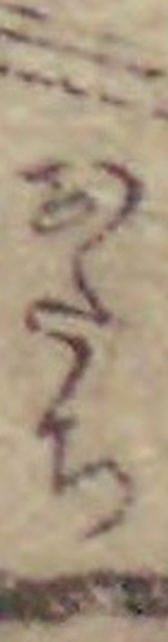おたち
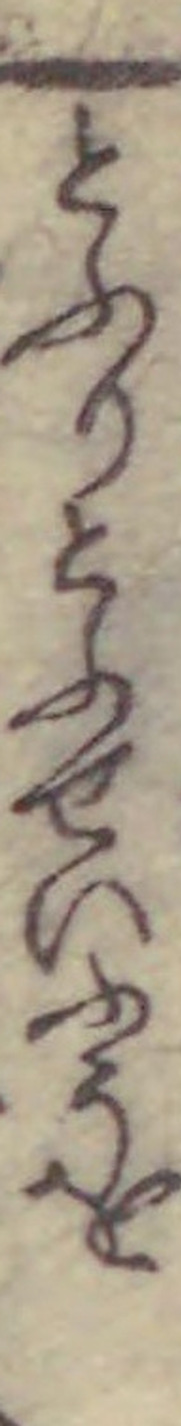とふりとふせいふうを
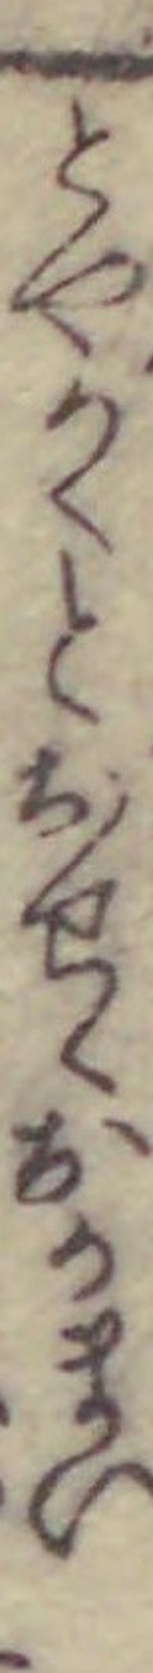とやかくとおせくおかまい
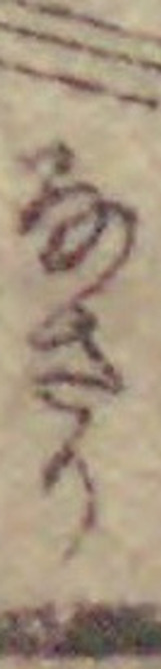なさり
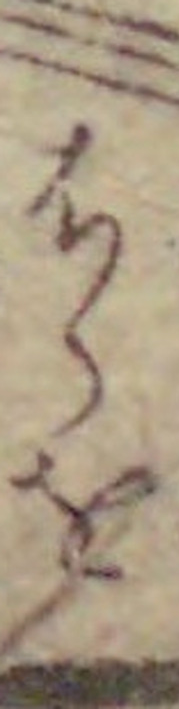はらを
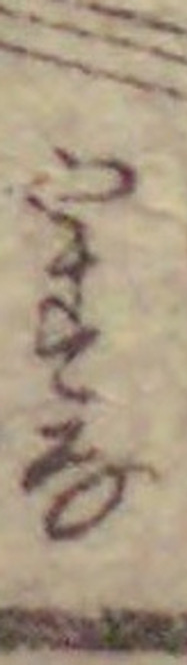やすな
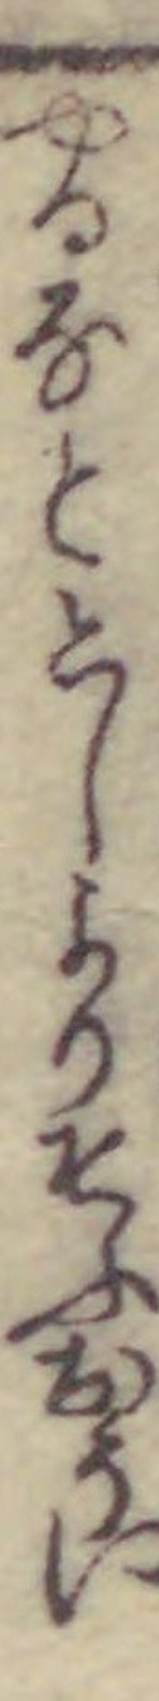やるなととしよりそふおうに
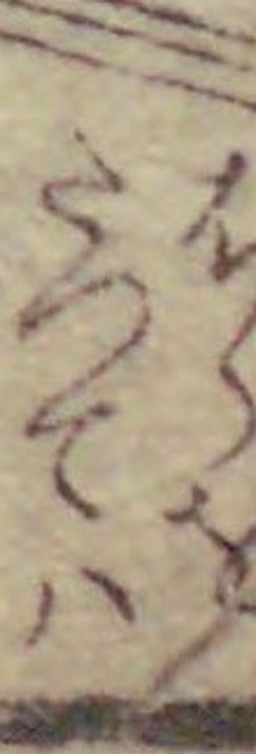たつては
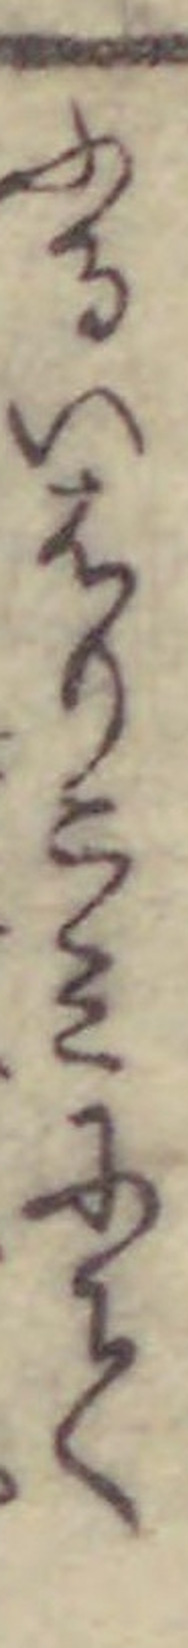ふるいはりこみにて
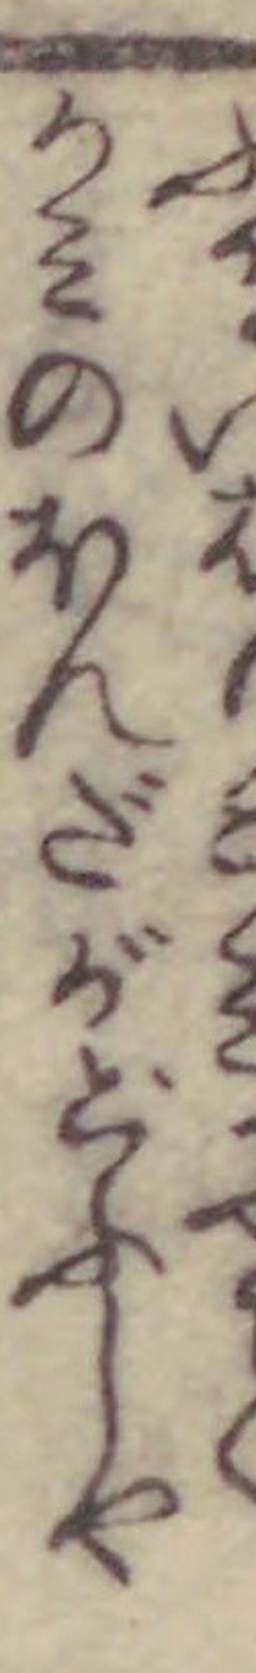かみのほんだがどふしや
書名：大通人穴[サガシ] 3巻
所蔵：国立国会図書館 National Diet Library, JAPAN
